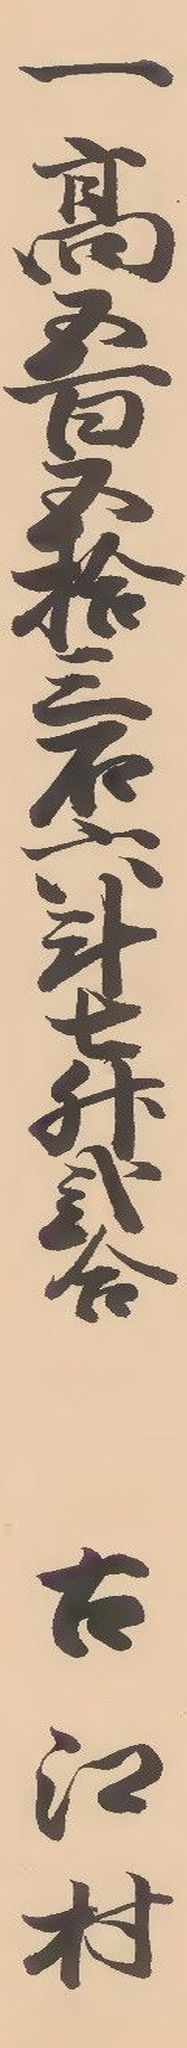一高五百五拾三石六斗七升弐合古江村

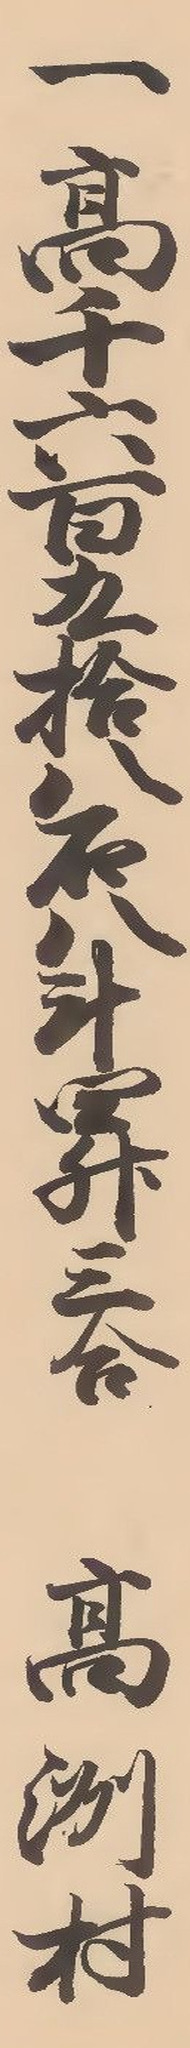一高千六百九拾八石八斗四升三合高洲村
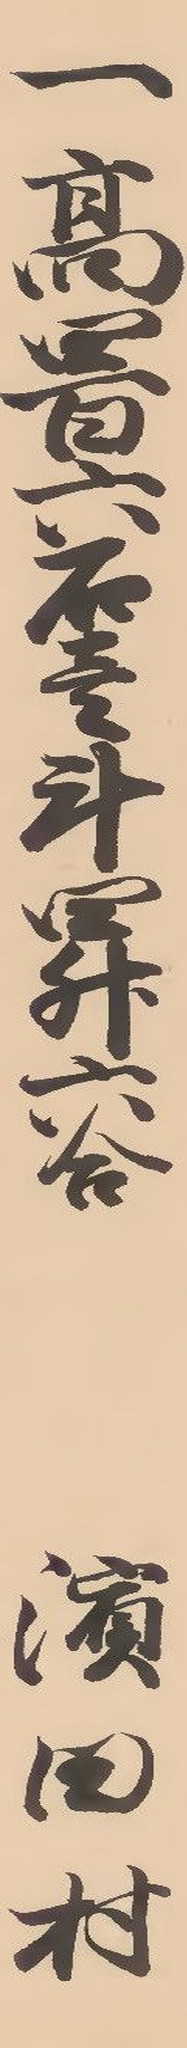一高四百六石壱斗四升六合浜田村
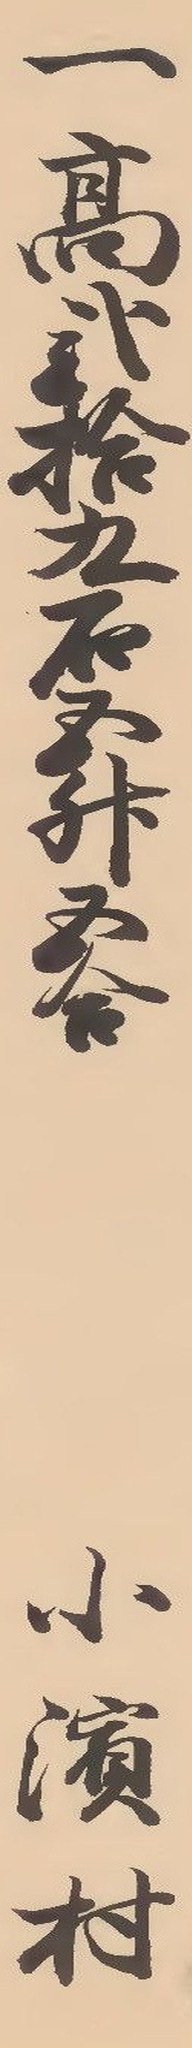一高弐拾九石五升五合小浜村
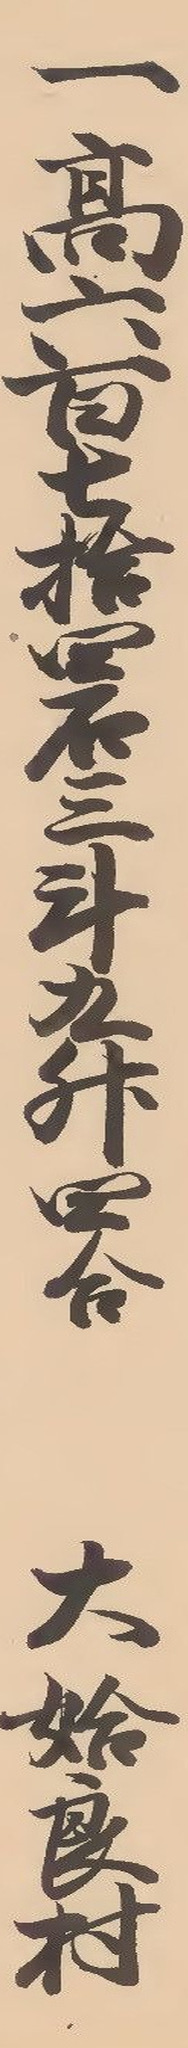一高六百七拾四石三斗九升四合大姶良村
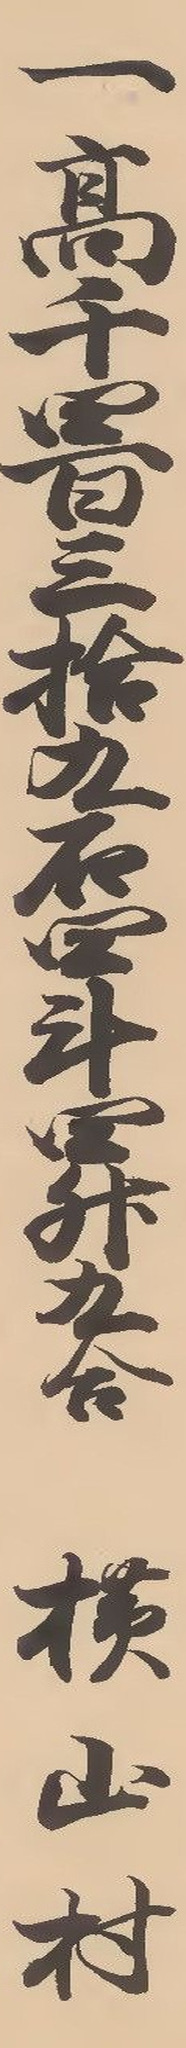一高千四百三拾九石四斗四升九合横山村
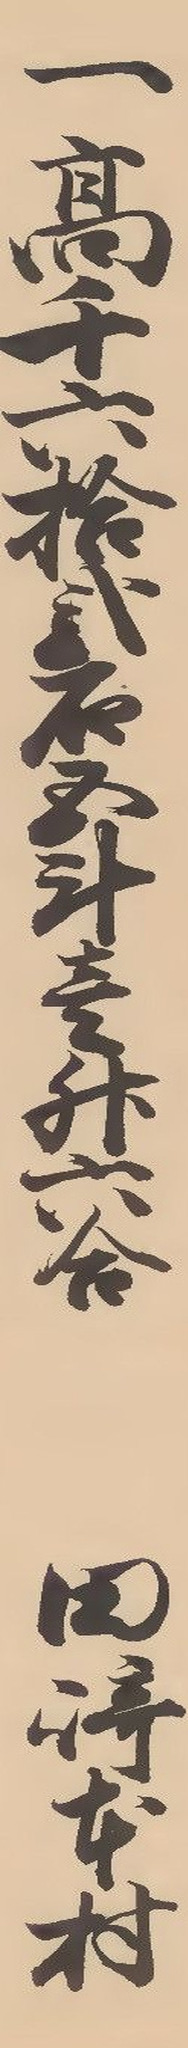一高千六拾弐石五斗壱升六合田崎本村
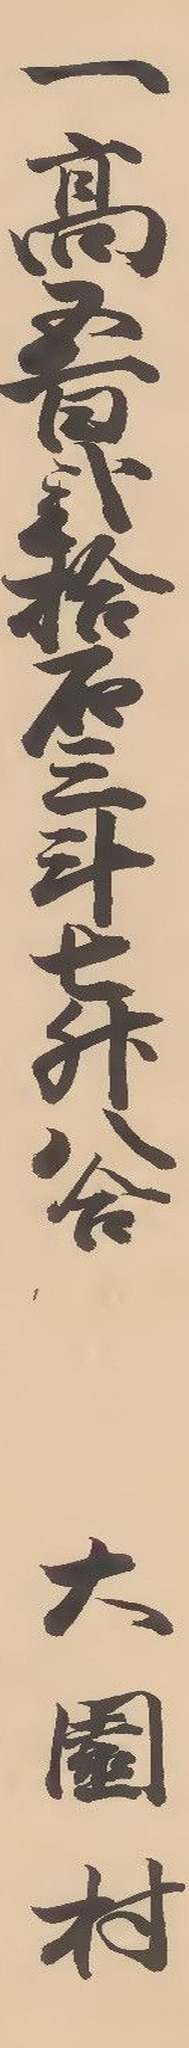一高五百弐拾石三斗七升八合大園村
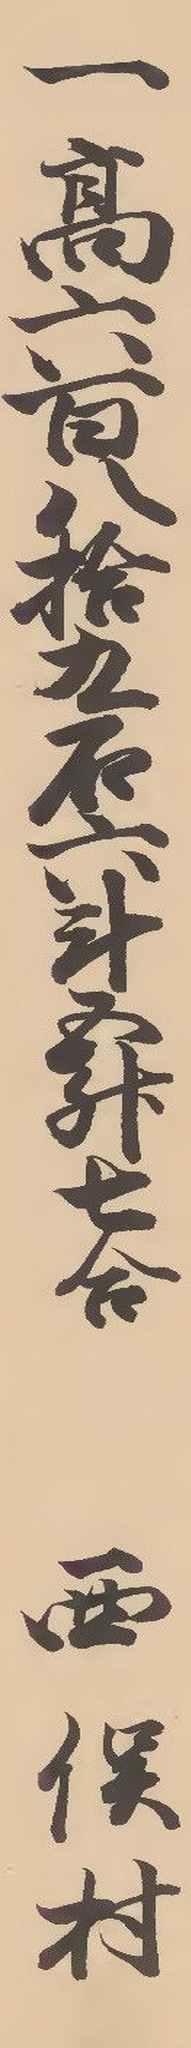一高六百八拾九石六斗五升七合西俣村

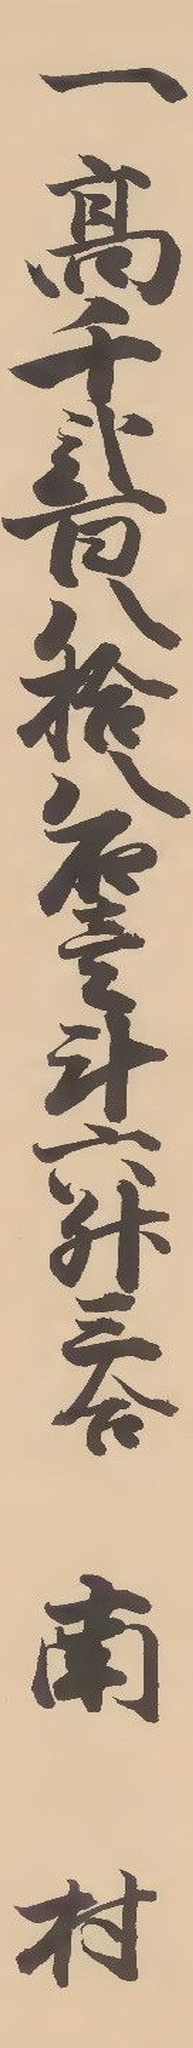一高千弐百八拾八石壱斗六升三合南村
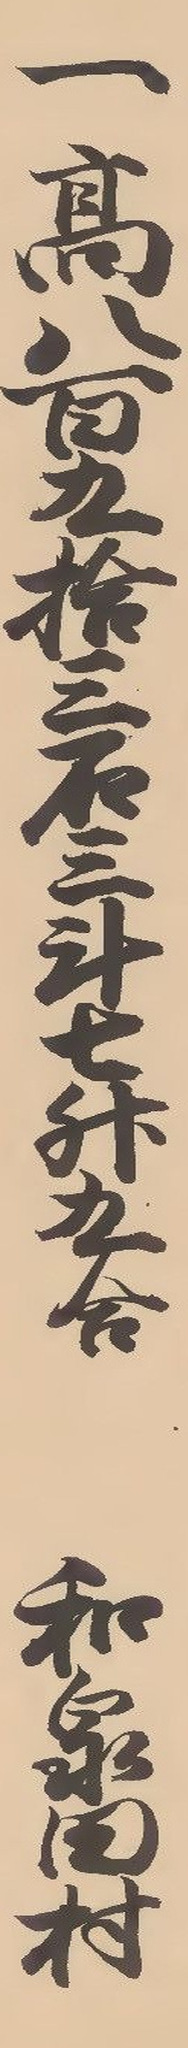一高八百九拾三石三斗七升九合和泉田村
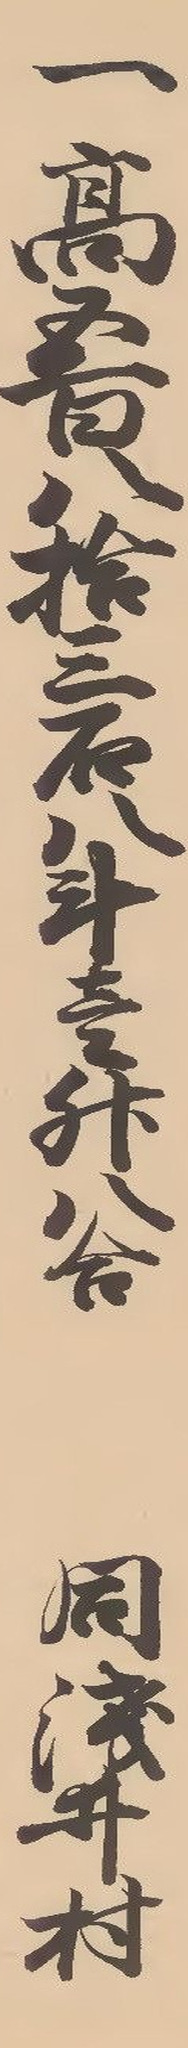一高五百八拾三石八斗壱升八合同浅井村
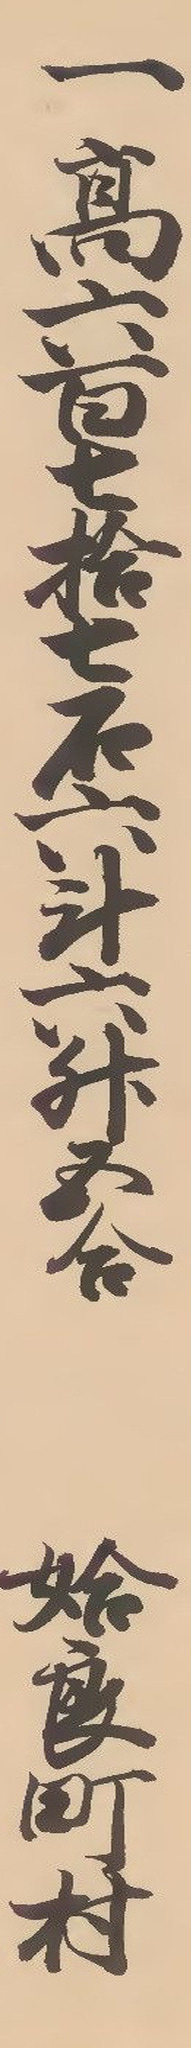一高六百七拾七石六斗六升五合姶良町村
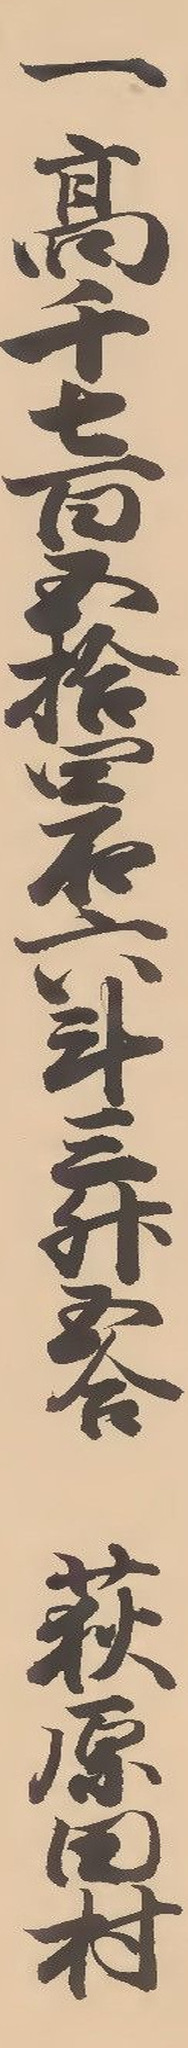一高千七百五拾四石六斗三升五合荻原田村
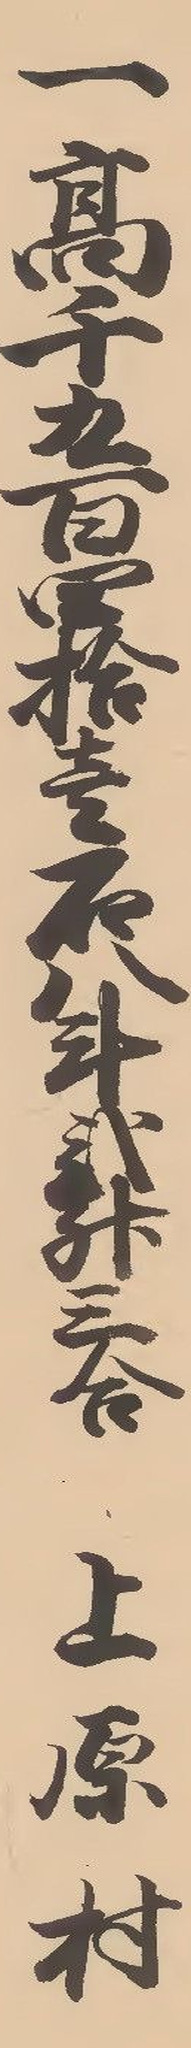一高千九百四拾壱石八斗弐升三合上原村
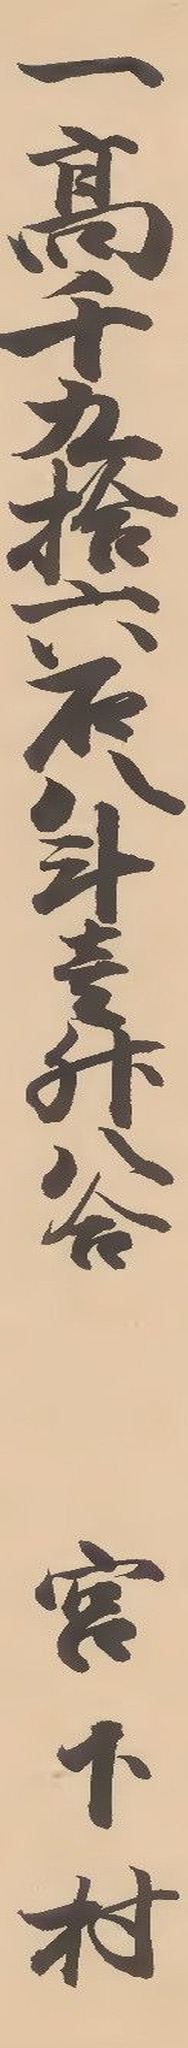一高千九拾六石八斗壱升八合宮下村
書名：大隅国郷帳
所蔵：国立公文書館 National Archives of Japan
